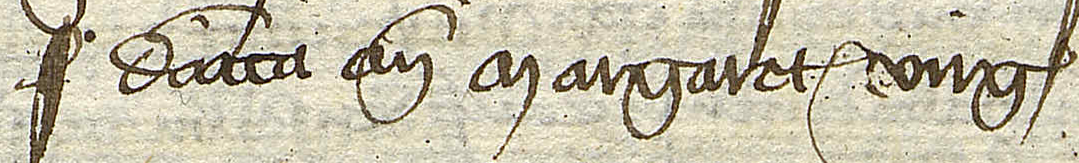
f* doica* an* Margaret* virg*
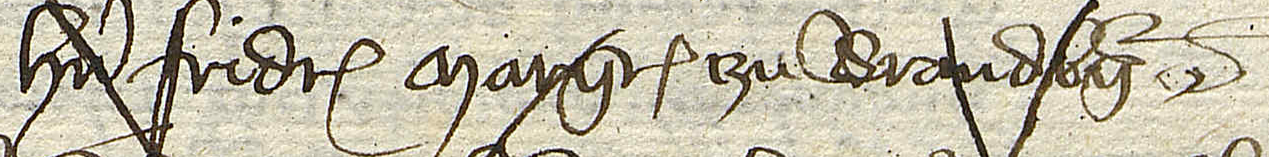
H*n Fridr* Margr* cʒu Brand*b*g ec*
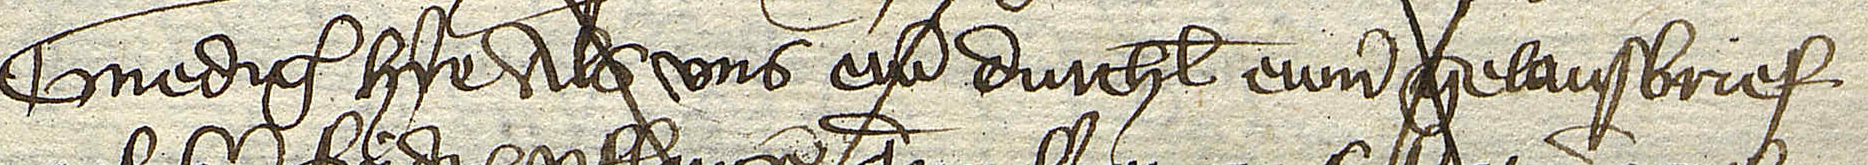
Gnedig* h*re Als vns ew* durchl* ew*n gelauſbrief
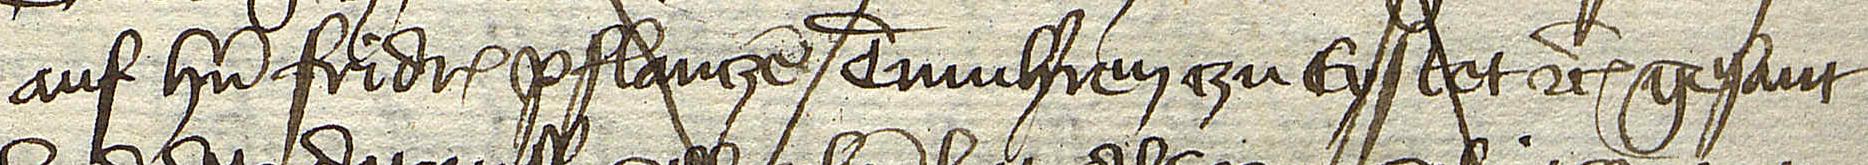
auf h*n Fridr* pflancʒe* Tumh*ren cʒu Eyſtet ec* geſant
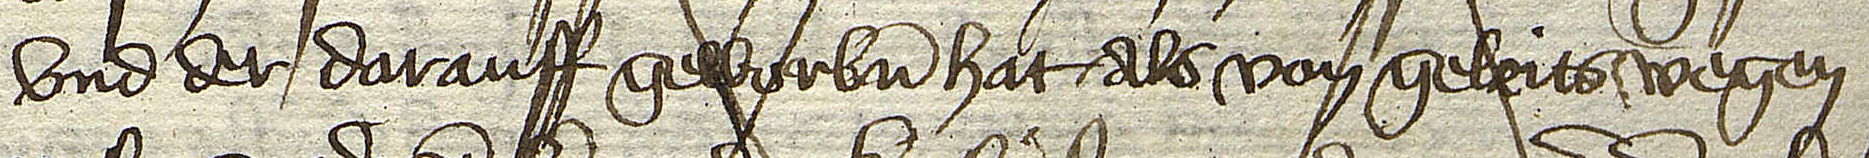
vnd der darauff geworb*n hat / als von geleits wegen
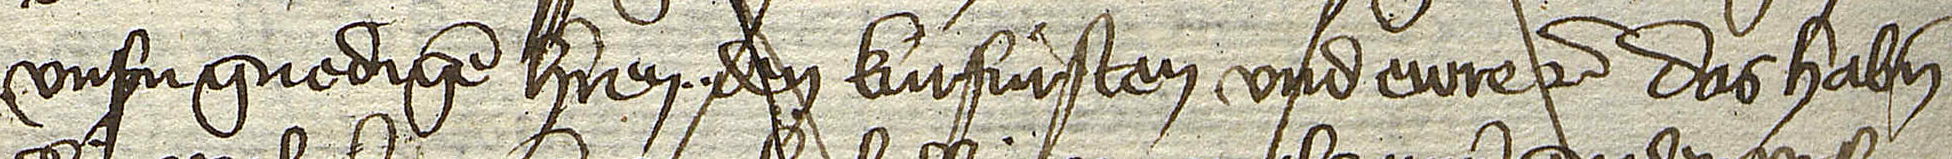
vnſ*n gnedige* h*ren ~ den kürfürſten vnd ewre ec* Das hab*n
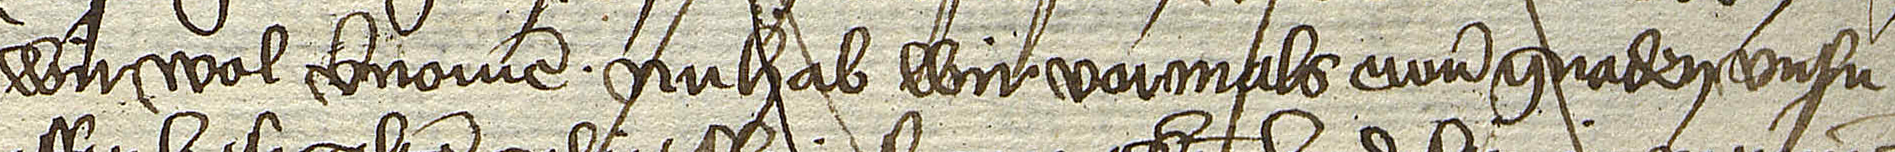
wir wol v*nome* . Nu hab wir vormals ew*n gnaden vnſ*n
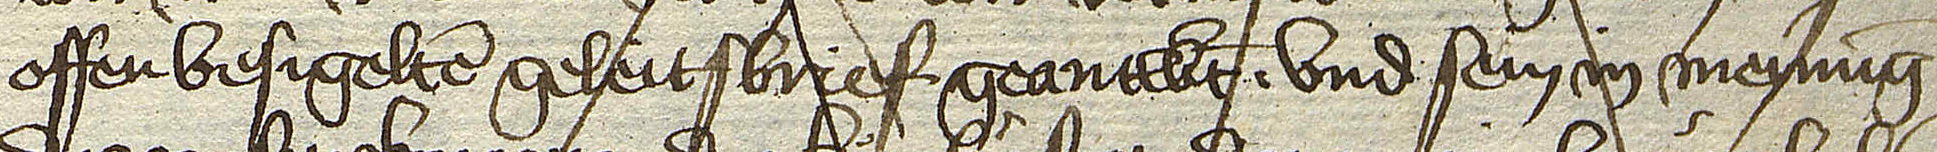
offen beſigelte* geleitſbrief geantw*t . vnd ſein in meynu*g
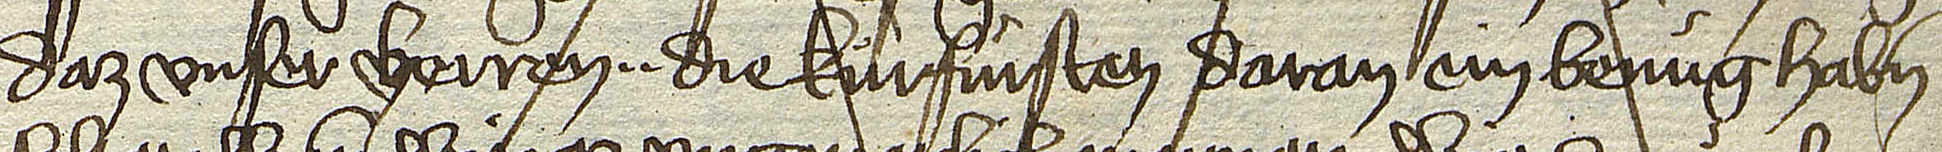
daʒ vnſer herren ~ die kürfürſten daran ein benüg hab*n
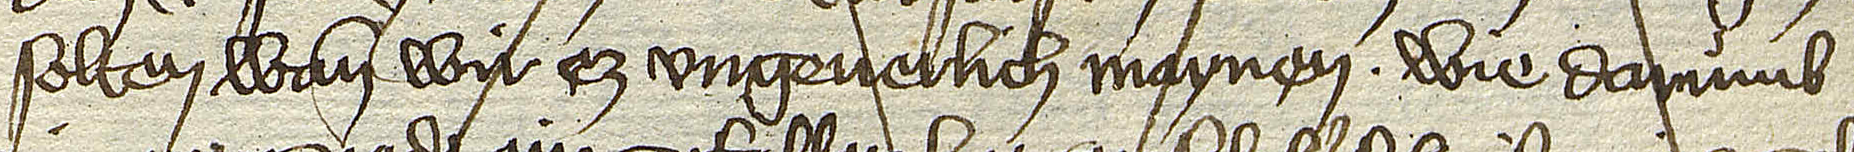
ſolten wan* wir eʒ vngeuerlich maynen . wie darümb
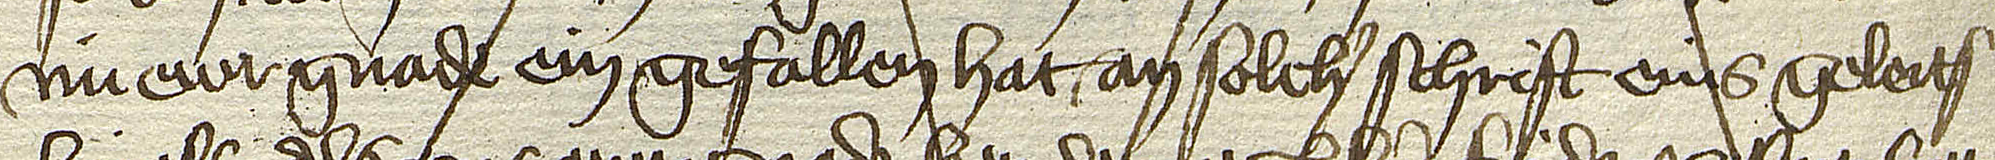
Nü ewr gnade ein gefallen hat / an ſolch* ſchrift eins geleitſ
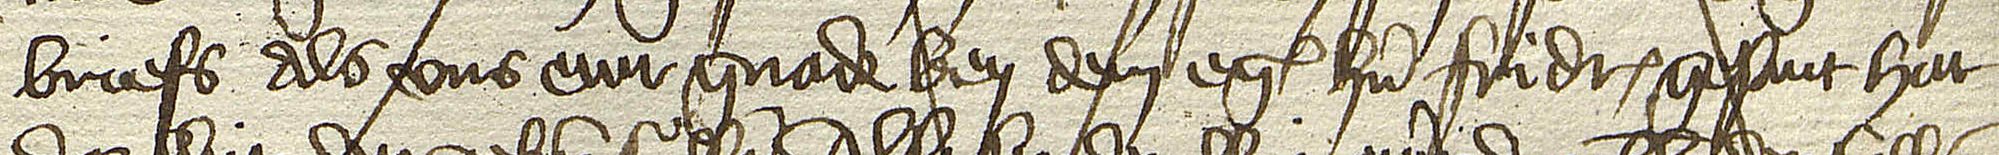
briefs Als vns ewr gnade bey dem eg* h*n Fridr* geſant hat
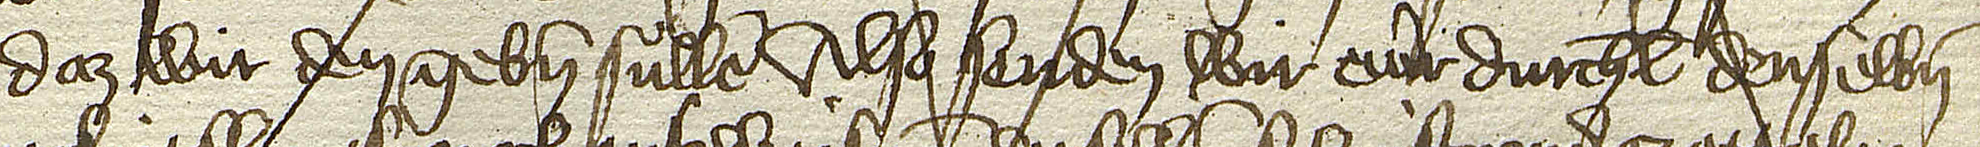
daʒ wir den geb*n ſülle* Alſo ſenden wir ew*r durchl* denſelb*n
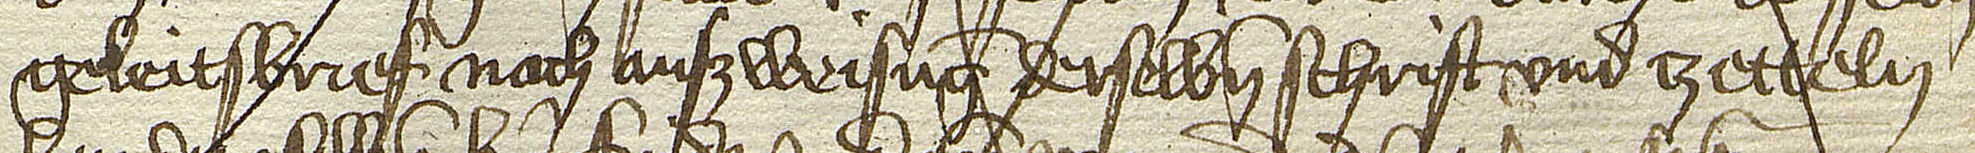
geleitſbrief nach auſʒweiſu*g derſelb*n ſchrift vnd cʒetteln
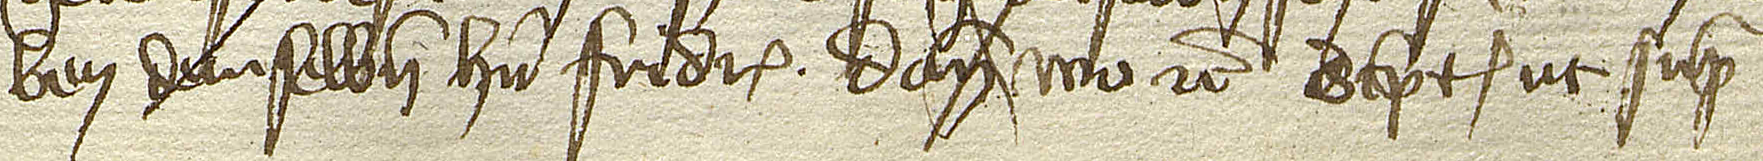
bey demſelb*n h*n fridr* . dan* wo ec* Sc*pt* ut ſup*
